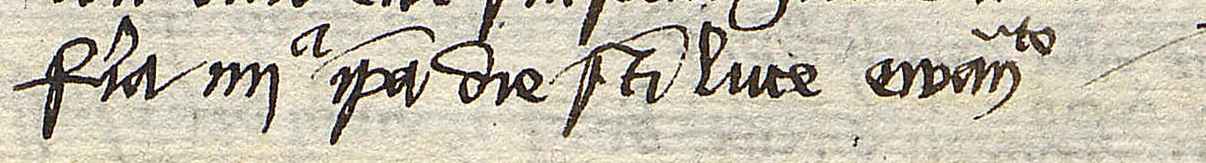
fi*a iiii* ipa* die ſci* luce ewan*
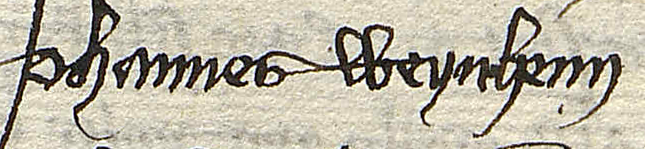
Iohannes Weynheim
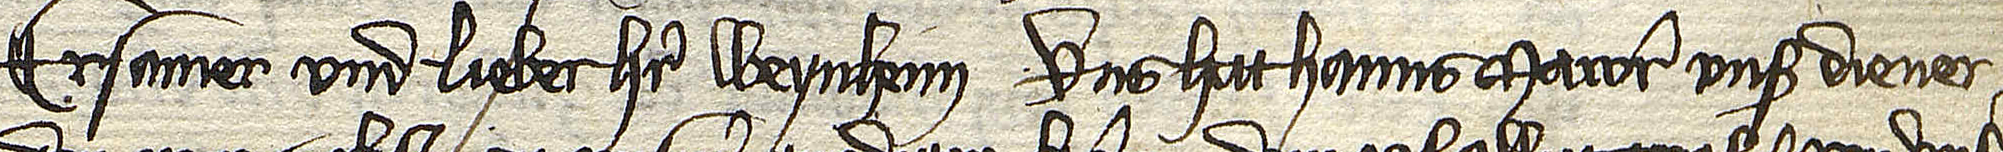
Erſamer vnd lieber hr* Weynheim . Vns hat hanns Mawr* vnſ* diener
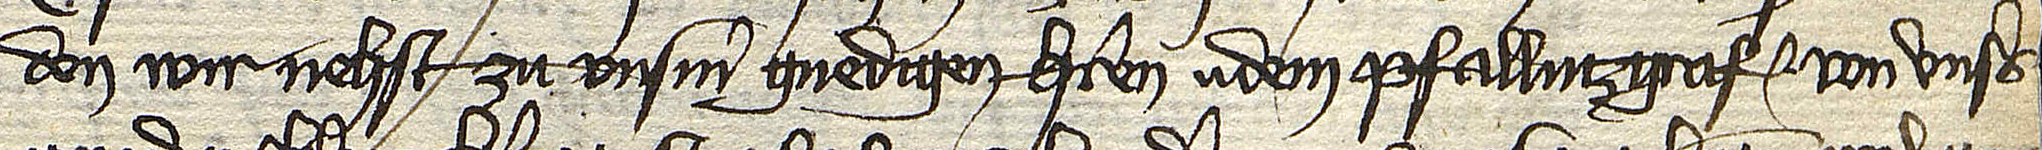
den wir nehſt ʒu vnſm* gnedigen h*ren ~ dem Pfallncʒgraf* von vnſ*s
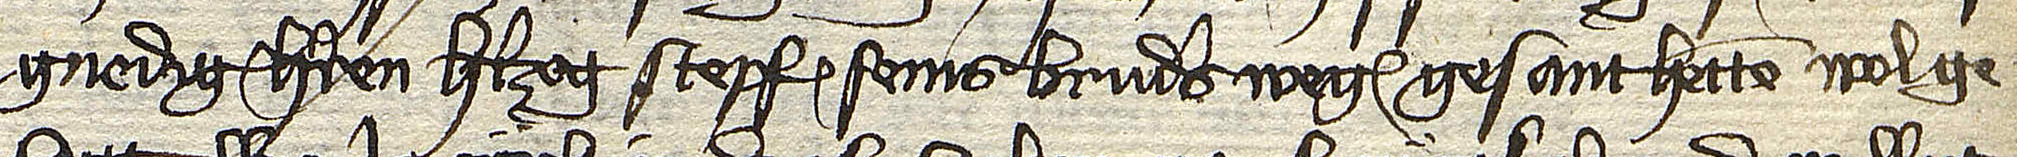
gnedig h*ren h*cʒog ſtepf* ſeins brud*s weg* geſant hette* wol ge -
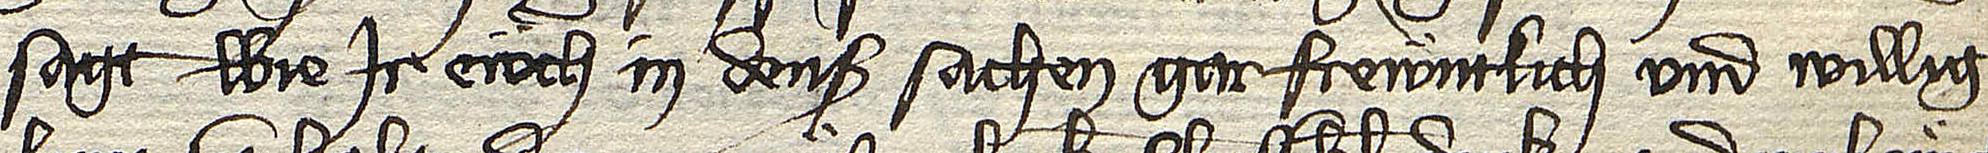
ſagt wie Ir eẅch in denſ* ſachen gar freẅntlich vnd willig
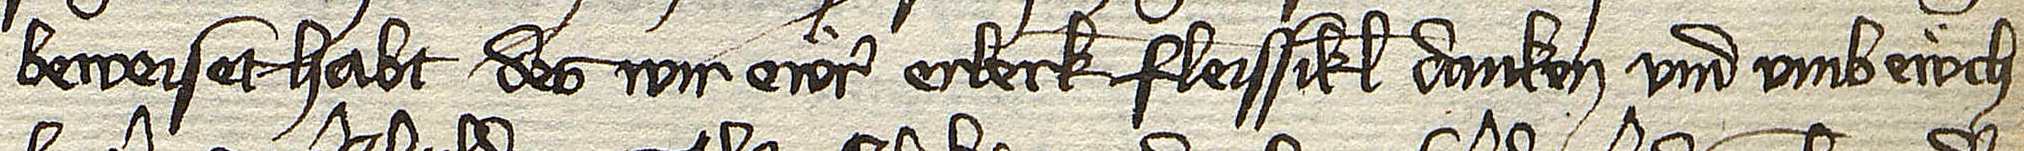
beweiſet habt / des wir eẅr* erberk* fleiſſikl* danken vnd vmb eẅch
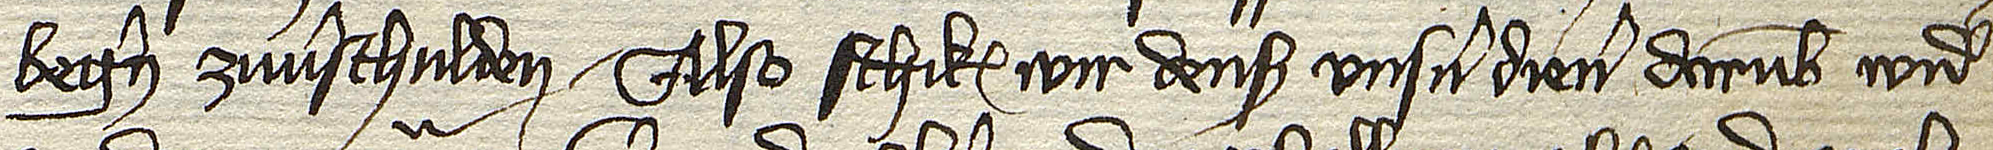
beg*n ʒuu*ſchulden / Alſo ſchik* wir denſ* vnſn* dien* darub* wid*
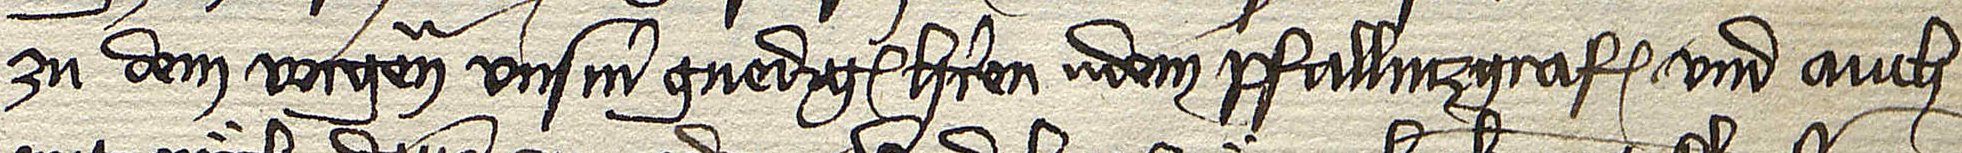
ʒu dem vorgen* vnſm* gnedig* h*ren ~ dem Pfallncʒgraf* vnd auch
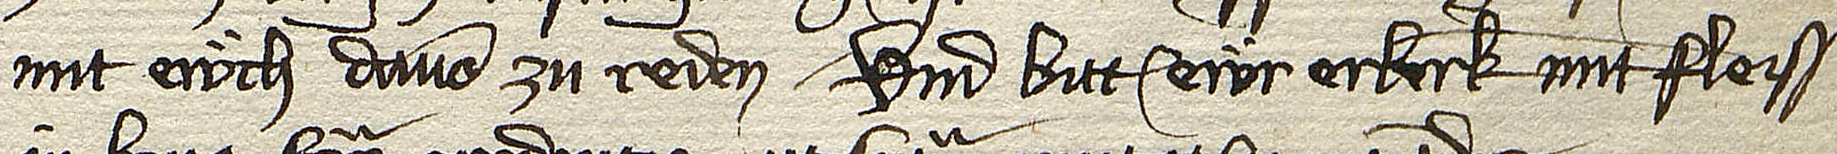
mit eẅch dauo* ʒu reden / Vnd bitt* eẅr erberk* mit fleiſſ
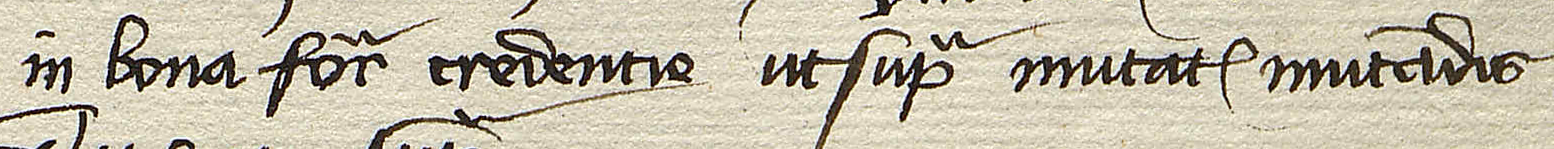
in bona for* credencie ut ſup* mutat* muta*dis
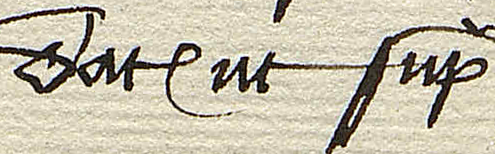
Dat* ut ſup*
